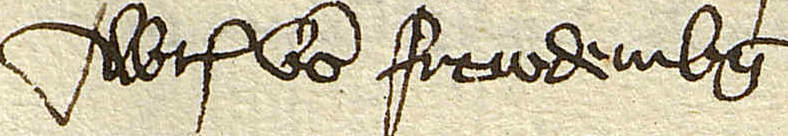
Albr* vo* Frewdenb*g
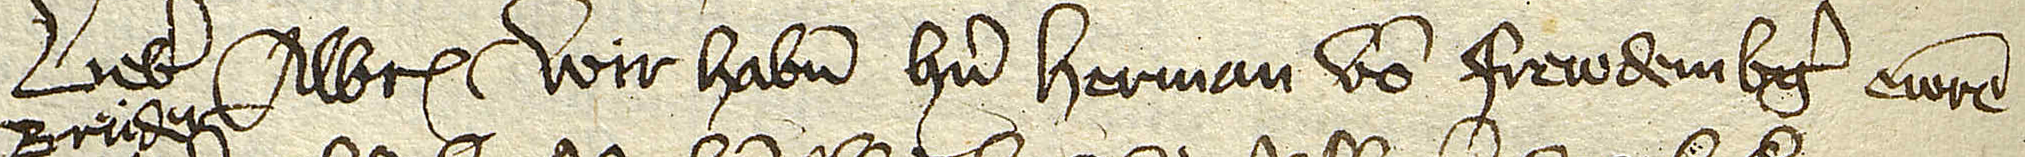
Lieb* Albr* / wir habn* hn* Herman vo* Frewdemb*g ewre*
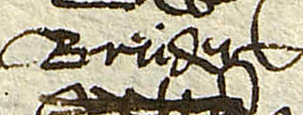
Brüder
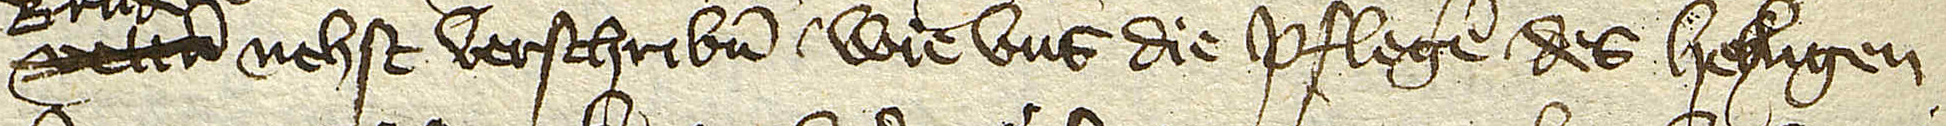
vettn* nehſt verſchribn* / wie vns die Pflege* des heyligen
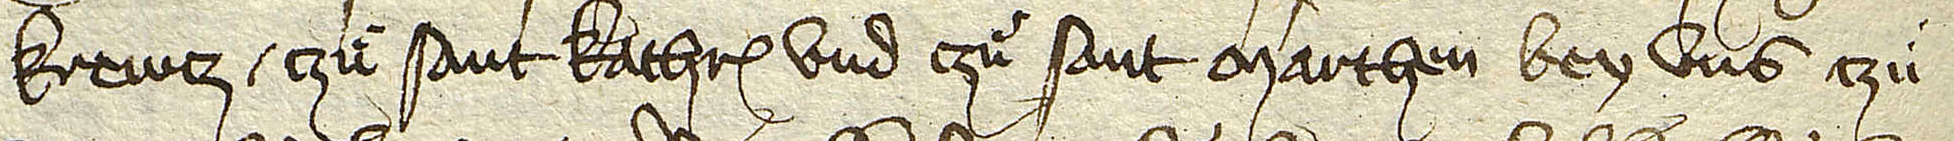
krewcʒ / cʒü ſant kathr* vnd cʒü ſant Marthein bey vns cʒü
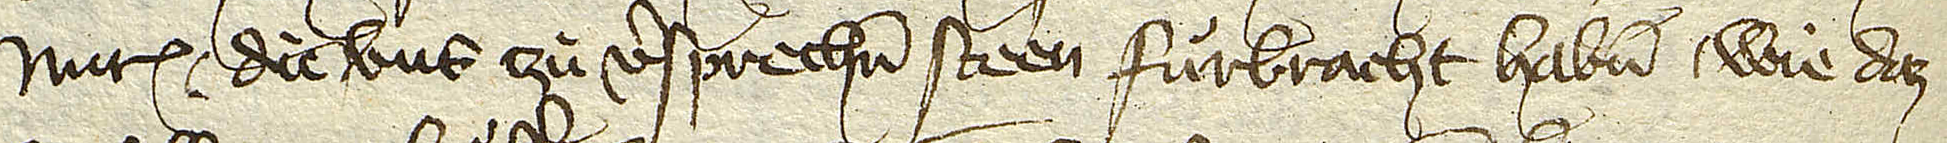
Nur* / die vns cʒü v*ſprechn* ſteen fürbracht habn* / wie daʒ
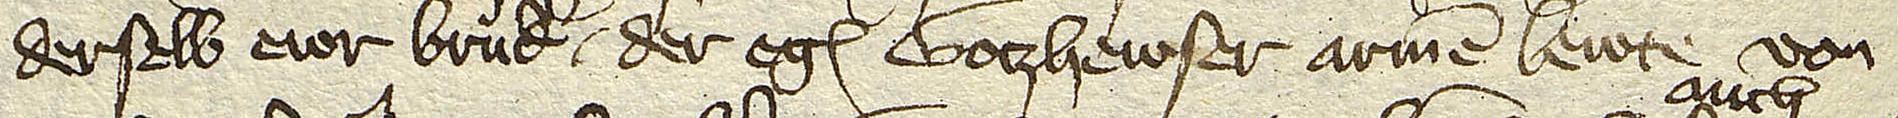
derſelb ewr brüd* / der eg* Gocʒhewſer arme* lewte von
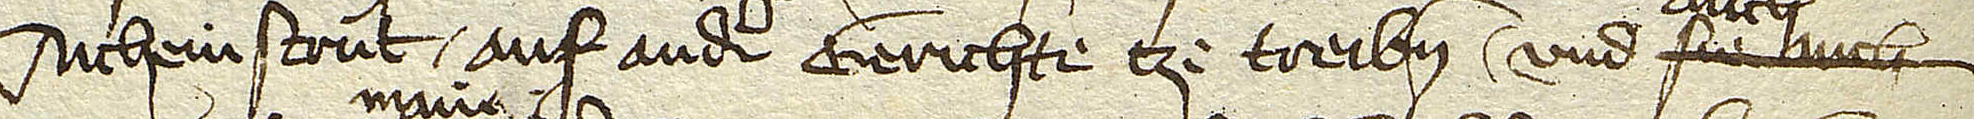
Aicheim ſtrüt / auf and* Herichte cʒe treibn* / vnd ſie auch
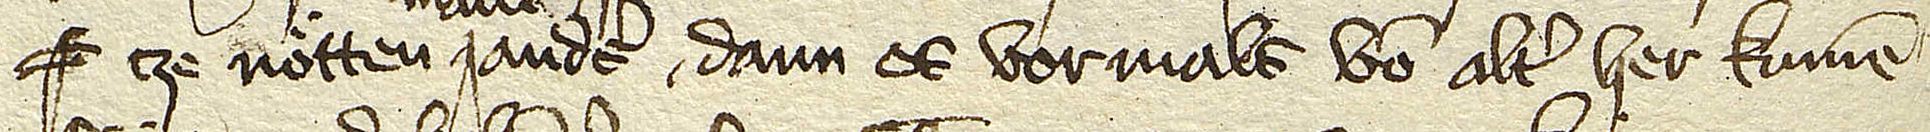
cʒe nötten / ands* / dann es vormals vo* alt* her kume*
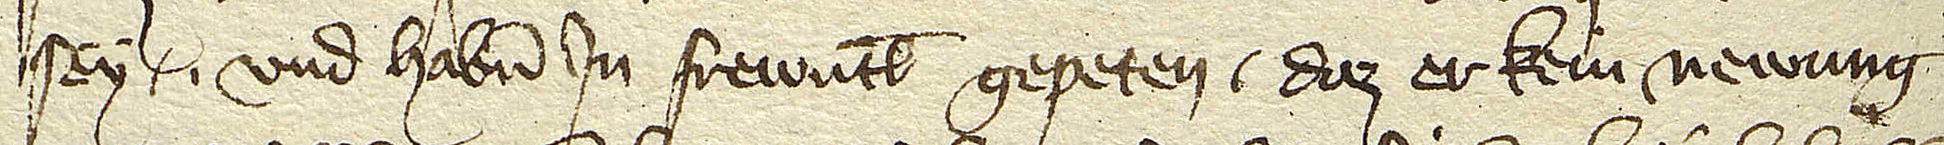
ſey /. vnd habn* In frewntl* gepeten / daʒ er kein newung
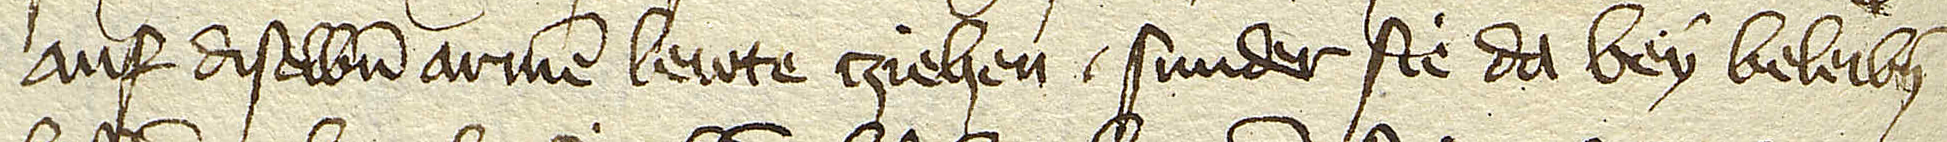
auf diſelb* arme* lewte cʒiehen / ſunder ſie da bey beleibn*
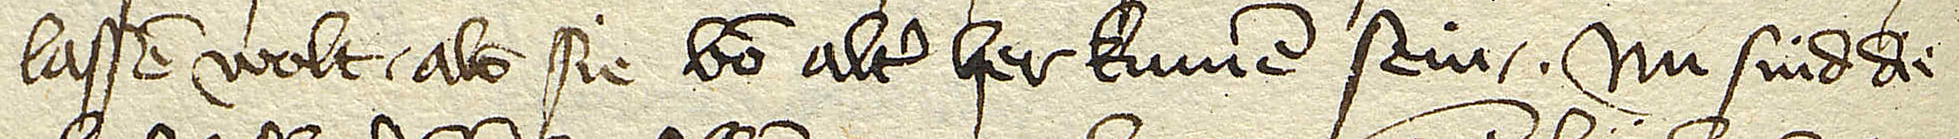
laſſe* wolt / als ſie vo* alt* her kume* ſein /. Nu ſind die
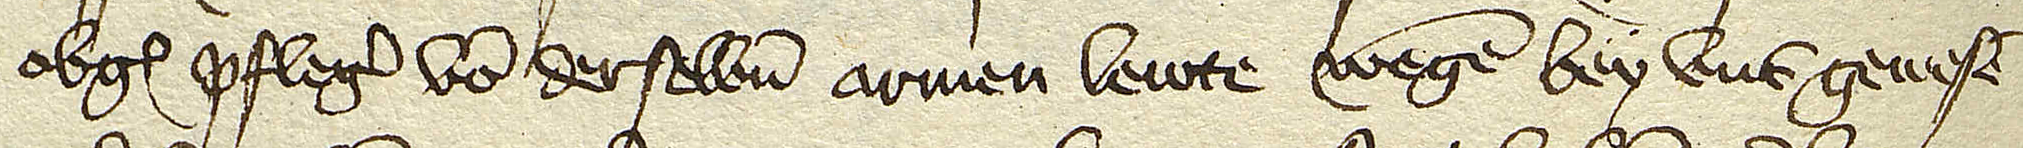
obg* pfleg* vo* derſelbn* armen lewte wege* bey vns geweſe*
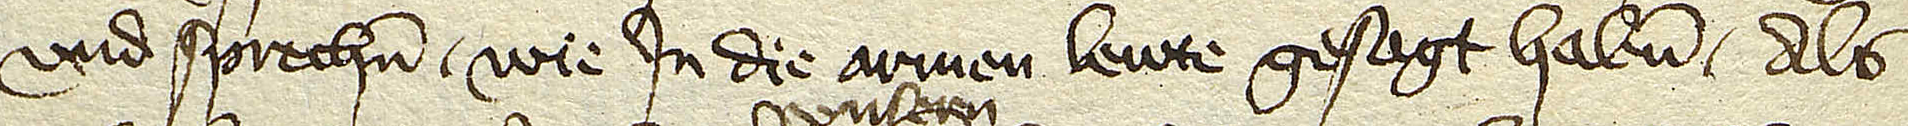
vnd ſprechn* / wie In die armen lewte geſagt habn* / Alſo
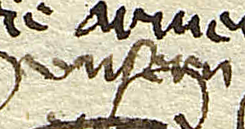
vnſern
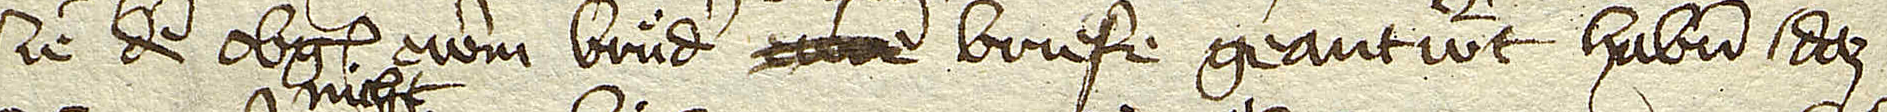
ſie d* obg* ew*m brüd* ewre* briefe geantwt* habn* / daʒ
